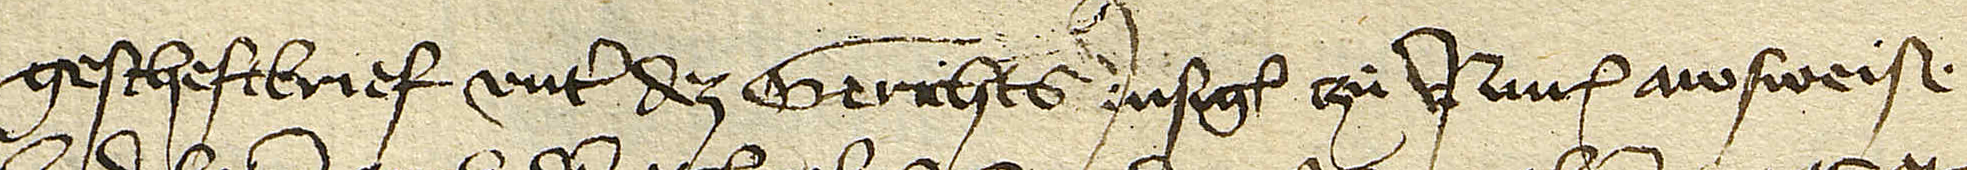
geſcheftbrief vnt* deʒ Gerichts Inſig* cʒü Nur* awſweiſe
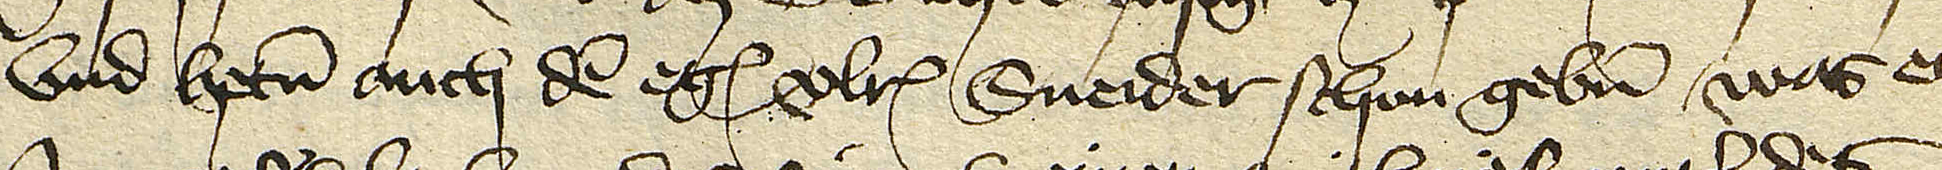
vnd hetn* auch d* eg* vlr* Sneider ſchon gebn* / was er
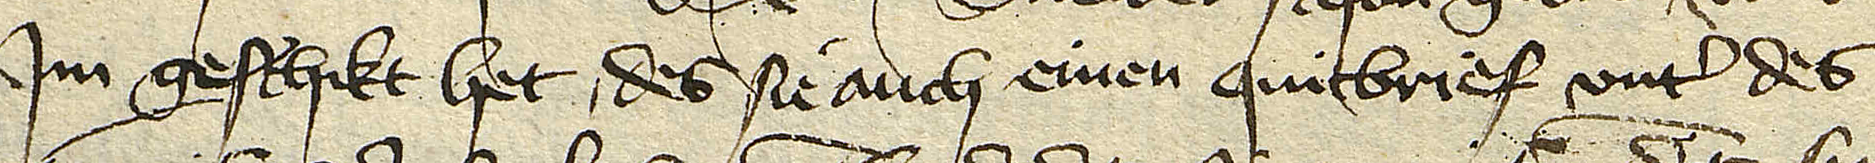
Im geſchikt het / des ſie auch einen quitbrief vnt* des
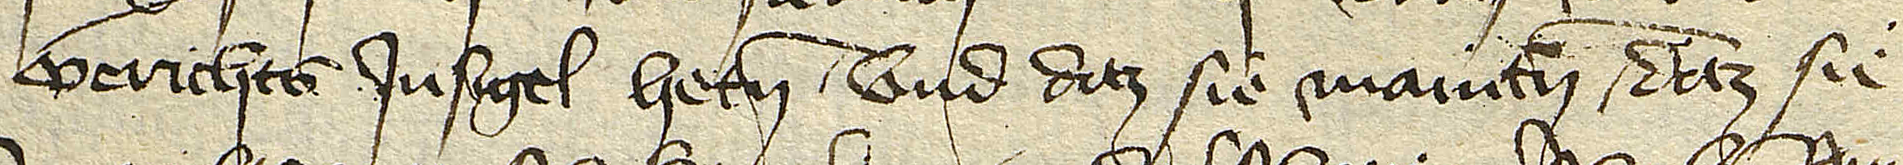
Gerichts Inſigel hetn* / vnd daʒ ſie maintn* / daʒ ſie
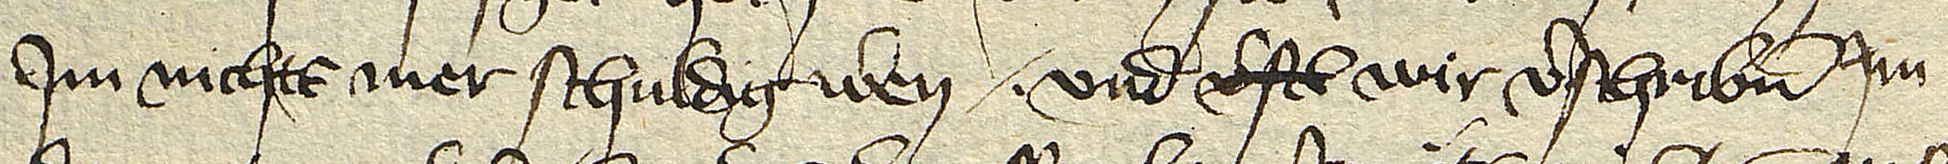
Im nichts mer ſchuldig w*en /. vnd v*ſc wir v*ſchribn* Im
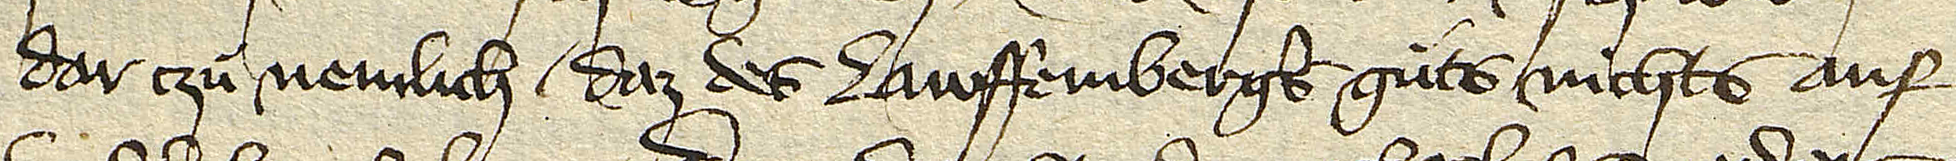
dar cʒü nemlich / daʒ des lawffemberg*s güts nichts auf
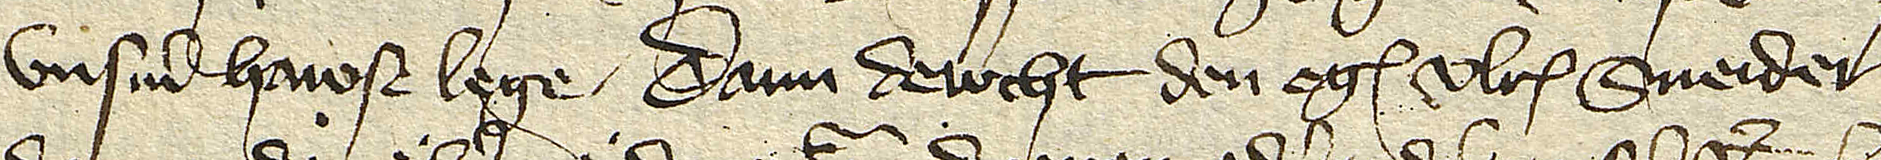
vnſm* hawſe lege / Dann dewcht den eg* vlr* Sneider
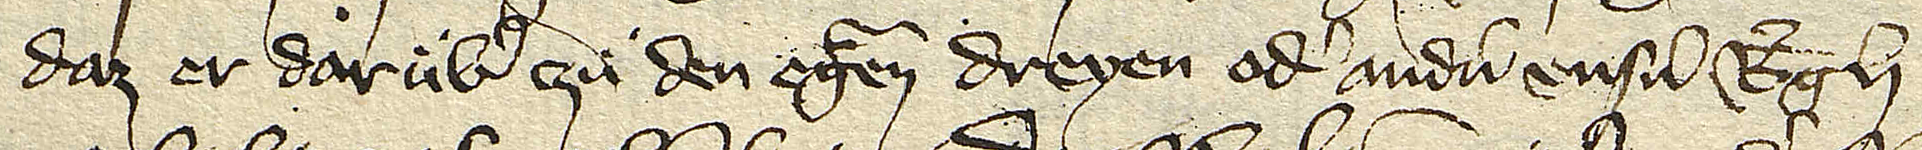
daʒ er darüb* cʒü den egen* dreyen od* andn* vnſn* B*gn*
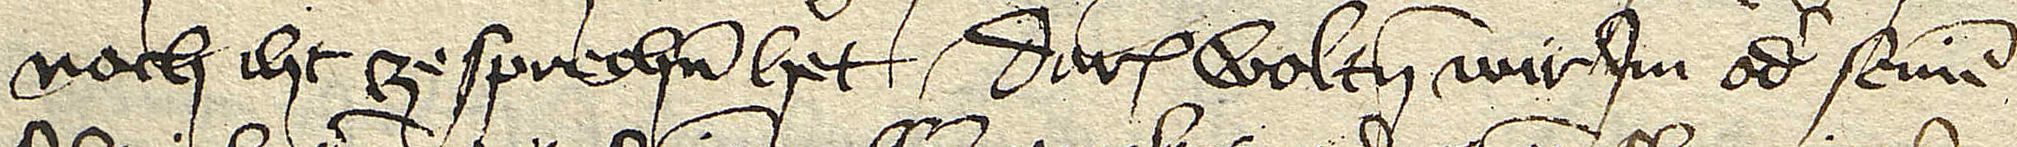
noch iht cʒeſprechn* het / Dar* woltn* wir Im od* ſeine*
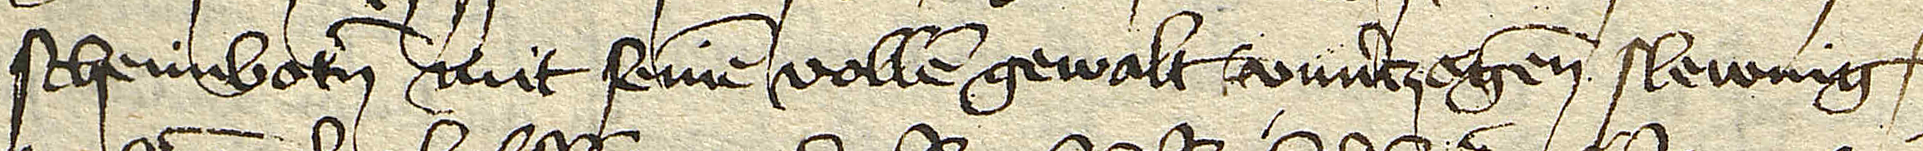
ſcheimbotn* mit ſeine* volle* gewalt / vun*cʒogen* ſlewnig*
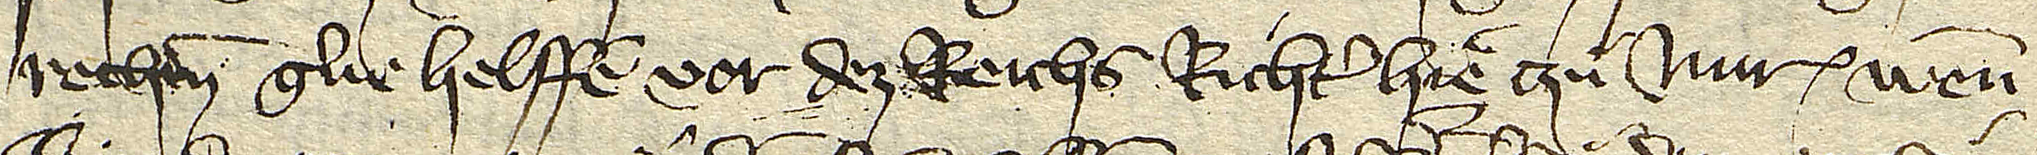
rechtn* g*ne helffe* vor deʒ Reichs Richt* hie cʒü Nur* wen*
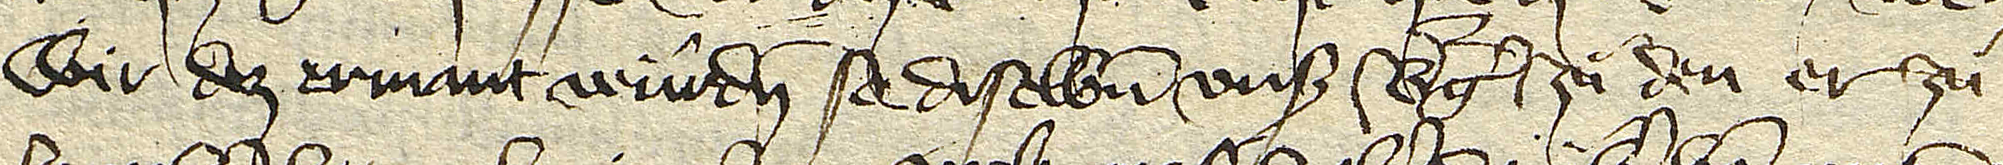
wir deʒ ermant würdn* ſo diſelbn* vnſ* B*g* cʒü den er cʒü
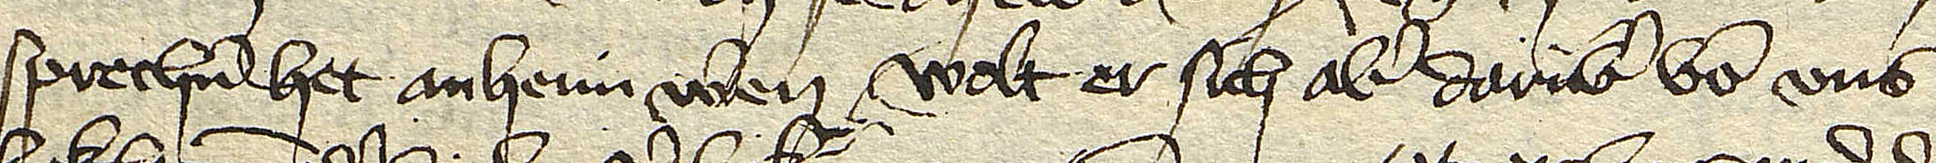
ſprechn* het anheim w*en / wolt er ſich ab* darüb* vo* vns
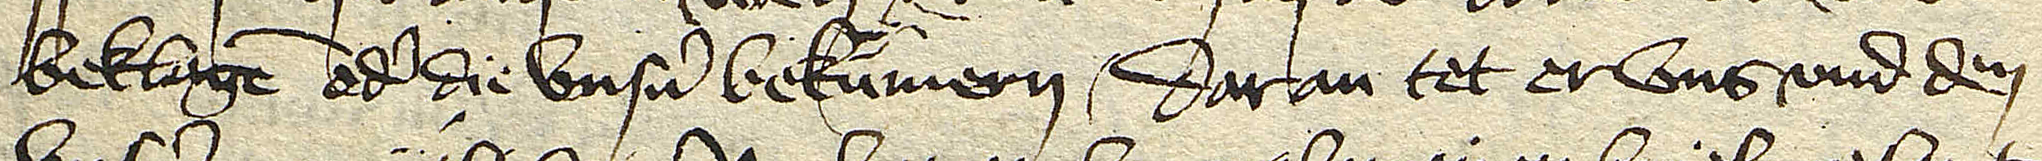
beklage* od* die vnſn* bekümern / Daran tet er vns vnd den
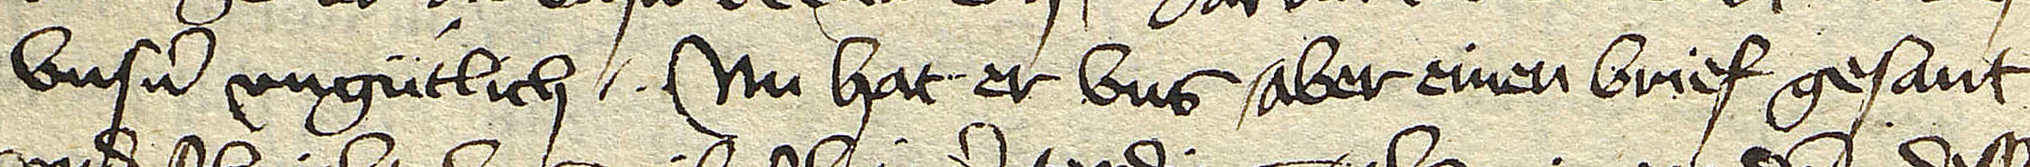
vnſn* vngütlich / . Nu hat er vns / aber einen brief geſant
